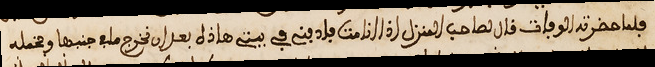فلما حضرته الوفات قال لصاحب المنزل اذا انا مت فادفنى في يبنى هاذه بعد ان نخرج ما في جنبها ونحمله
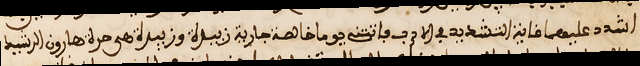اشدد عليهما غاية التشديد في الادب فاتتنى يوما خالصة جارية زبيدة وزبيدة هى حرة هارون الرشيد
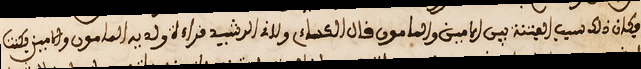فكان ذلك سبب الفتنة بين الامين والمامون قال الكساءى ولانى الرشيد قراءة ولدية المامون والامين فكنت
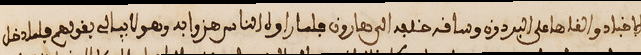الاخبار والقاها على البر دون وساقه خلفه الى هارون فلما راوه الناس هزوا به وهو لا يبالى بقولهم لهم فلما دخل
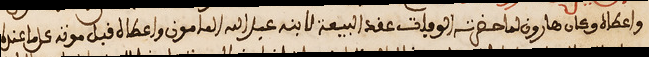واعطاه وكان هارون لما حضرته الوفات عقد البيعة لا بنه عبد الله المامون واعطاه قبل موته كل ماعنده
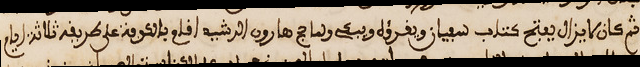ثم كان لا يزال يفتح كتاب سفيان ويقرؤه ويبكى ولما حج هارون الرشيد اقام بالكوفة على طريقه ثلاثة ايام
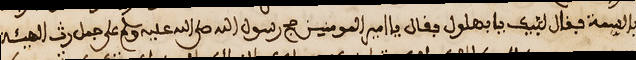بالسمة فقال لبيك يا بهلول فقال يا امير المومنين حج رسول الله صلى الله عليه وسلم على جمل رث الهيئة
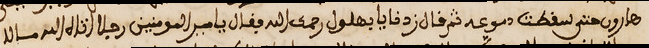هارون حتى سقطت دموعه ثم قال زدنا يا بهلول رحمك الله فقال يا امير المومنين رجلا اتاه الله مالا
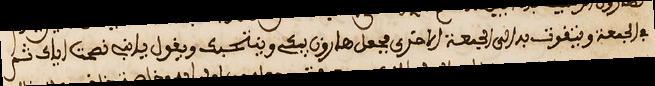في الجمعة ويتقوت به الى الجمعة الاخرى فجعل هارون يبكى ويقول يا بنى نصحت اياك ثم
